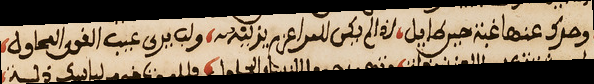وصدك عنها غبة حين طايل اذا لم يكن للمرا عزم يزينه ولب يرى عيب الغوى المحاول
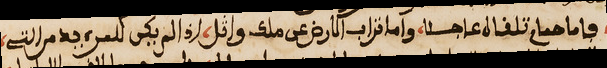فاما حمام تلقاه عاجلا واما تراب الارض عن ملك واثل اذا لم يكن للمرء يد من التى
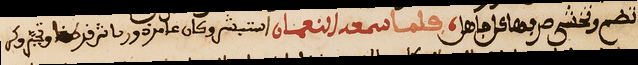تضم وتخشى صرفها كل جاهل فلما سمعه النعمان استبشر وكان عامر ذو رياش قد ط# وتجبروكر
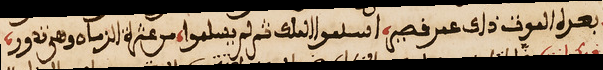بعده الموت ذاك عمر قصير اسلموا الملك ثم لم يسلموا من عثرة الزمان وهى تدور
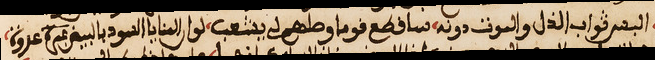البس ثواب الذل والموت دونه ساقطع قوما وصلهم لى يشعب لو ان المنايا السود بالبيض عمره عدوة
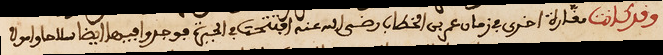وقد كانت مغارة اخرى في زمان عمر بن الخطاب رضى الله عنه اقتتحت في الحيرة فوجدوا فيها ايضا سلاحا وامولا
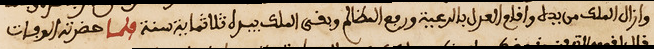وازال الملك من يده واقام العدل بالرعية ورفع المظالم وبقى الملك بيده ثلاثماية سنة فلما حضرته الوفات
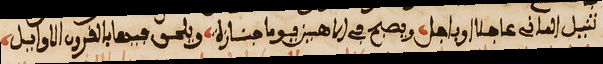تنيل المانى عاجلا وباجل ويصبح في الاهين يوما جنازة ويلحق فيها بالقرون الاوايل
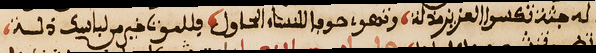له جثة تكسو العزيز مذلة وتهوء حوفا للنساء الحاول فللموت خير من لباسك ذلة
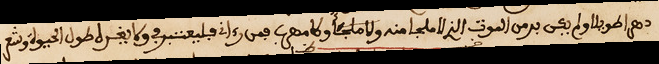دهرا طويلا ولم يكن بد من الموت الذي لا ملجا منه ولا ملجأ ولا مهرب فمن رءانى فليعتبر في ولا يغره طول الحيوة وشعر
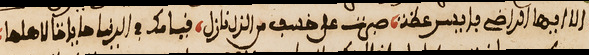الا ايها الرضى بايسر عظة صبرت على خسف من الذل نازل فيامك في الدنيا حاياتا لاهلها
